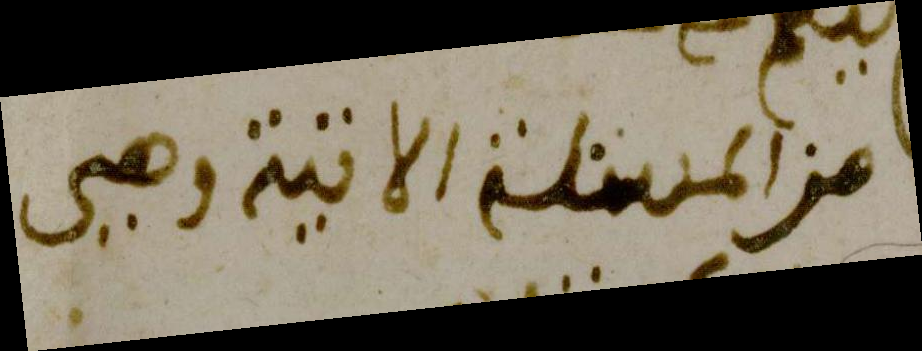عن المسئلة الاتية وهي
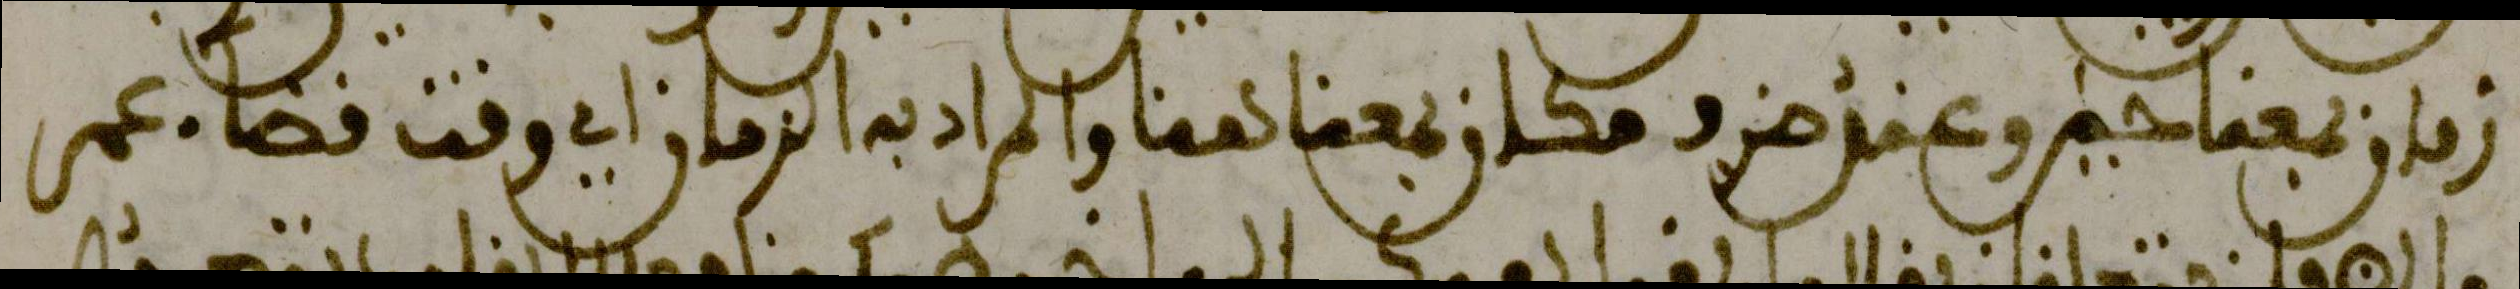زمان بمعنا حين وعند ضرف مكان بمعنا هنا والمراد به الزمان اي وقت قضاء عمر
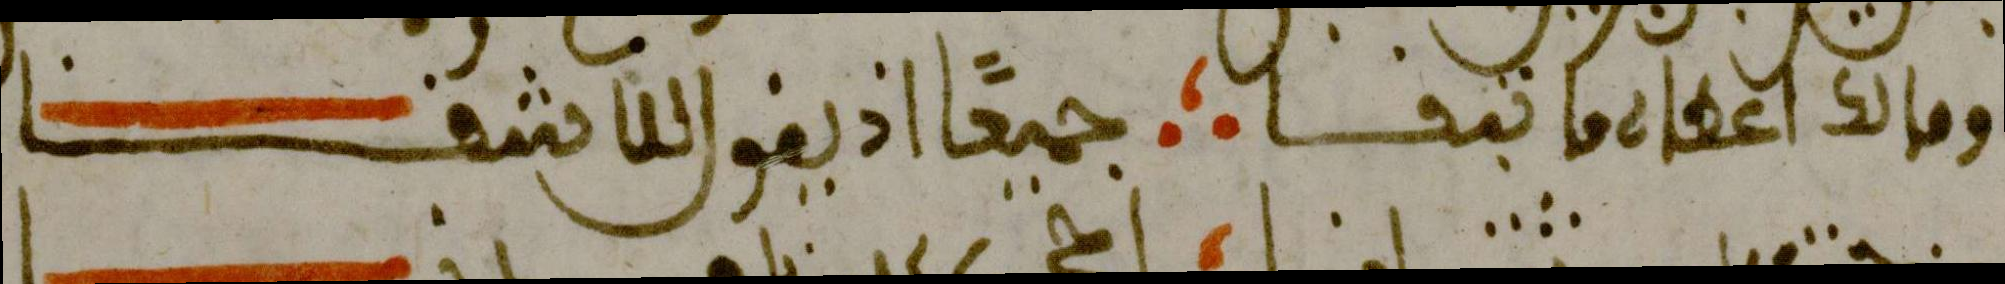ومالك اعطاه ما تبقا جميعًا اذ يقول للاشقا
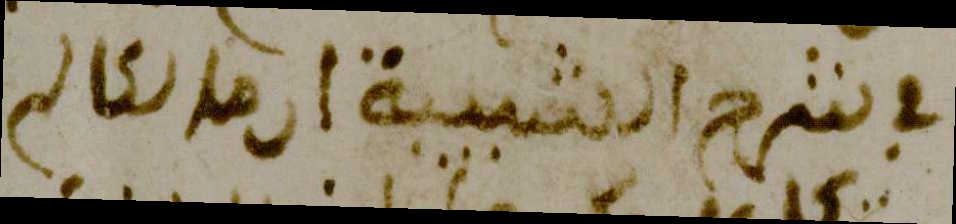في شرح الشبيبة ان مالكا لم
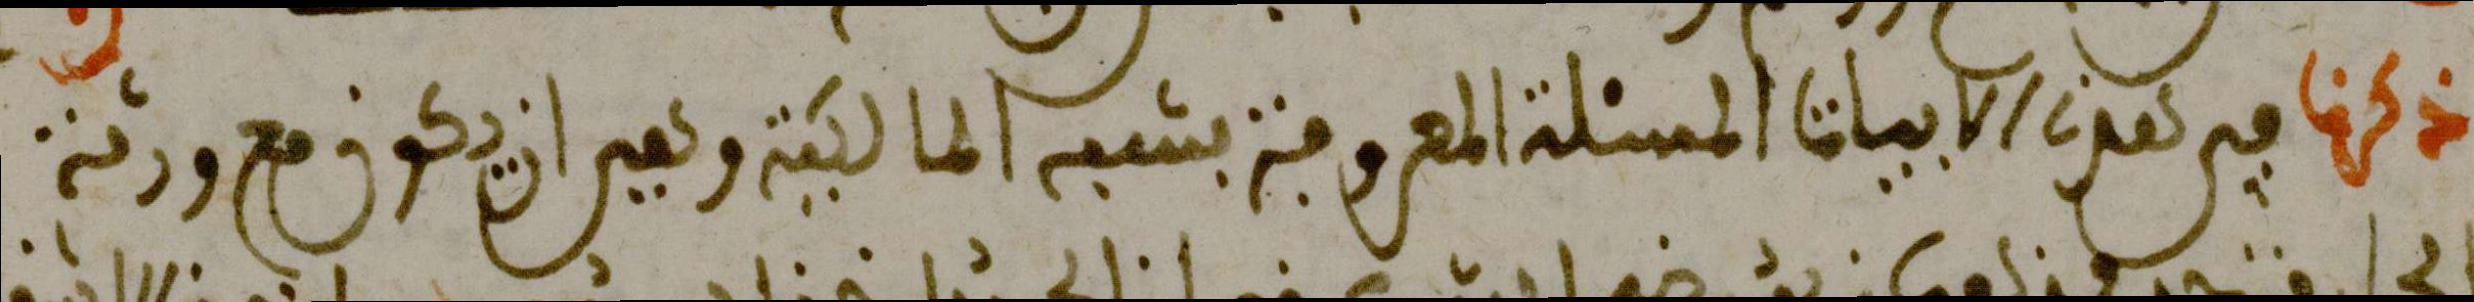ذكرن في هذه الابيات المسئلة المعروفة بشبه المالكية وهي ان يكون مع ورثة
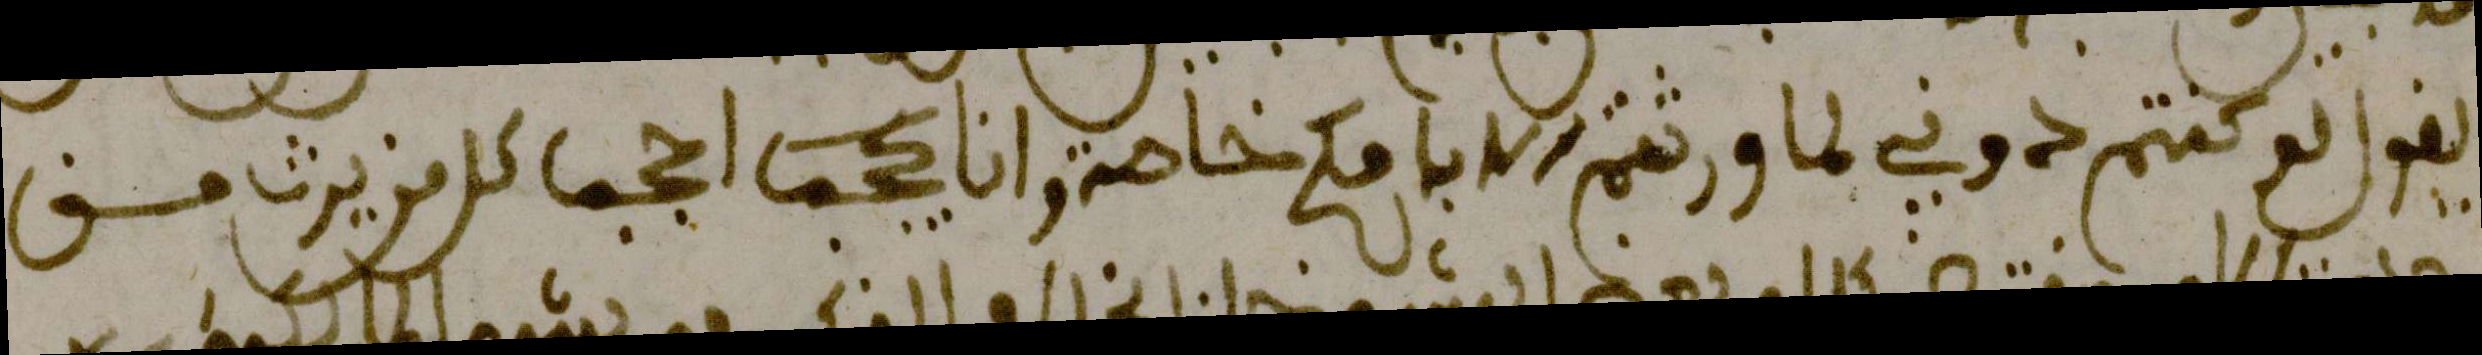يقول لو كنتم دوني لما ورثتم الا بامكم خاصة وانا يحجب احجب كل من يرث من
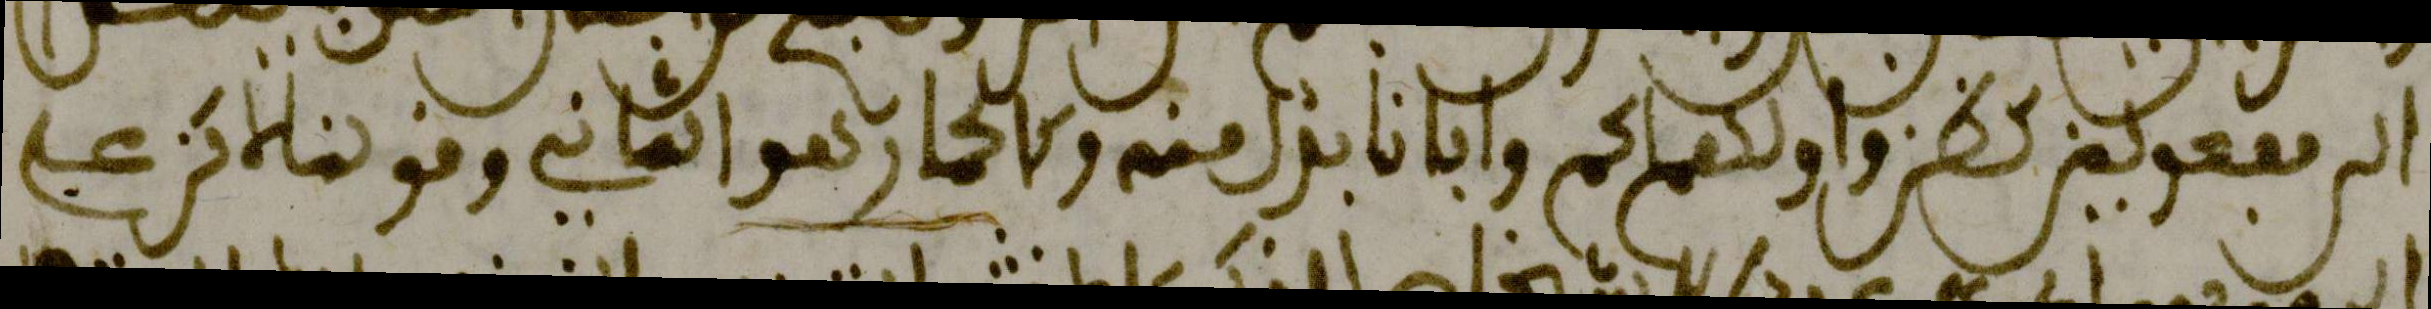الى مفعولين كظن واولهم ا كم وابانا بدل منه وكالحمار هو الثاني وقولنا لاكن على
